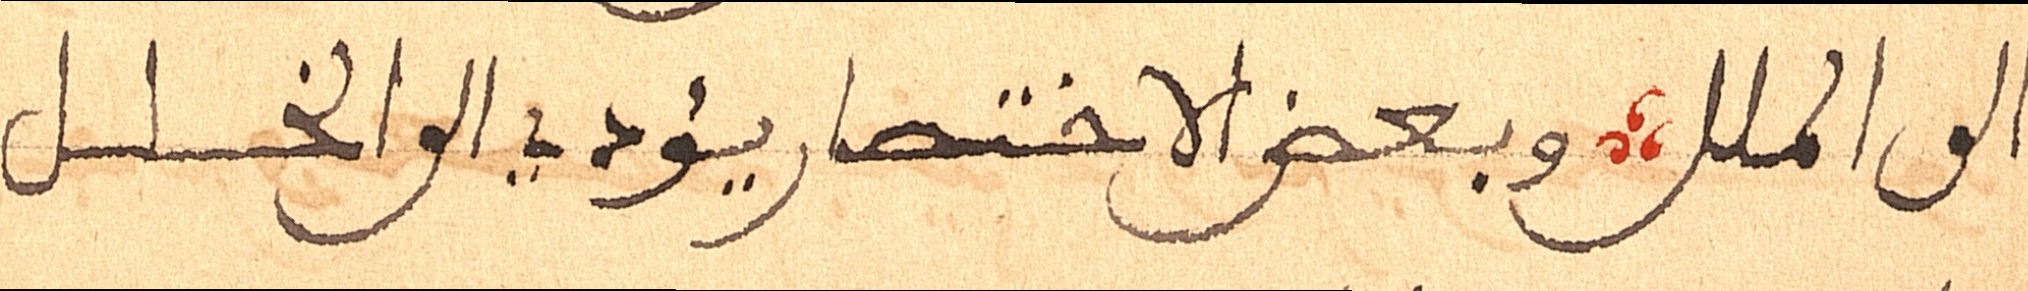الى املل وبعض الاختصار يؤدي الى الخلل
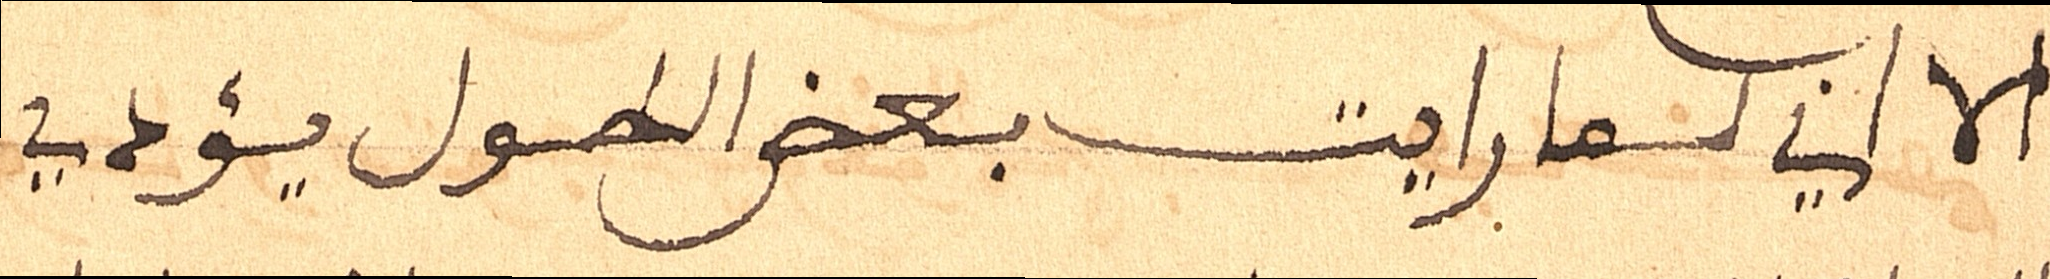الا اني لما رايت بعض الطول يؤدي
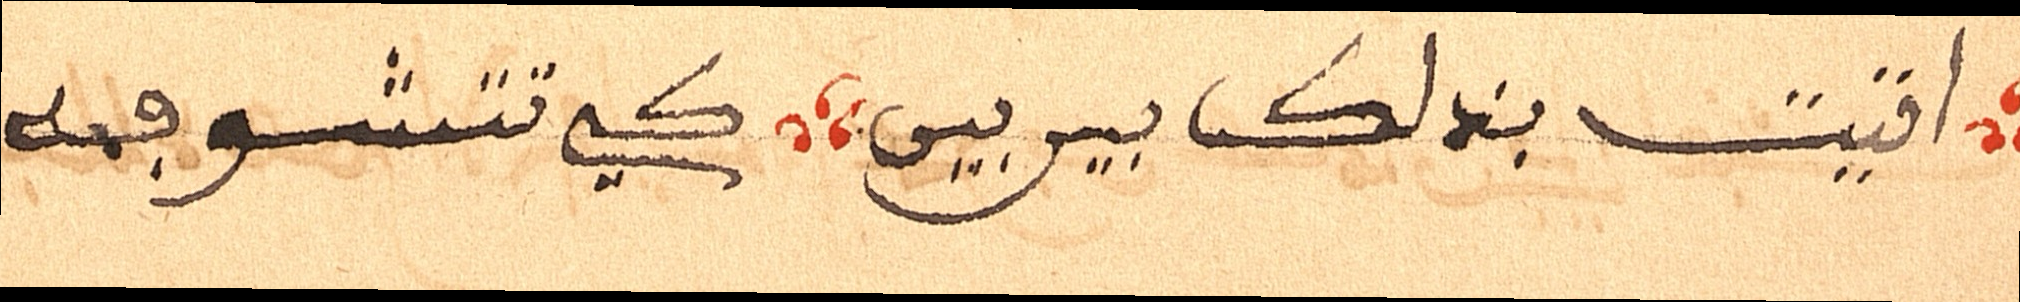اتيت بذلك بين بين كي تتشوفه
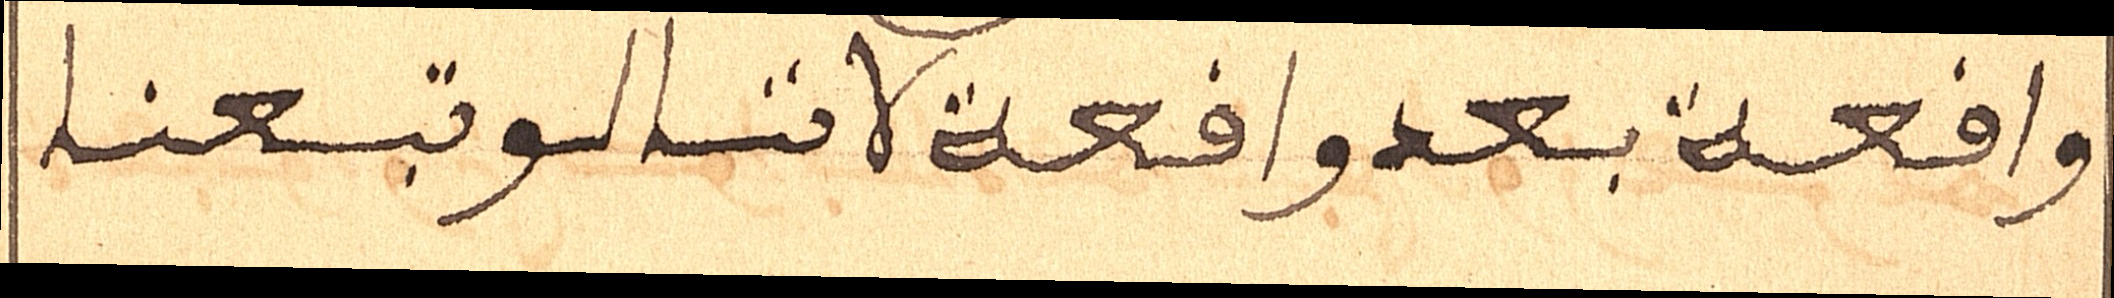واقعة بعد واقعة لاننا لو تبعنا
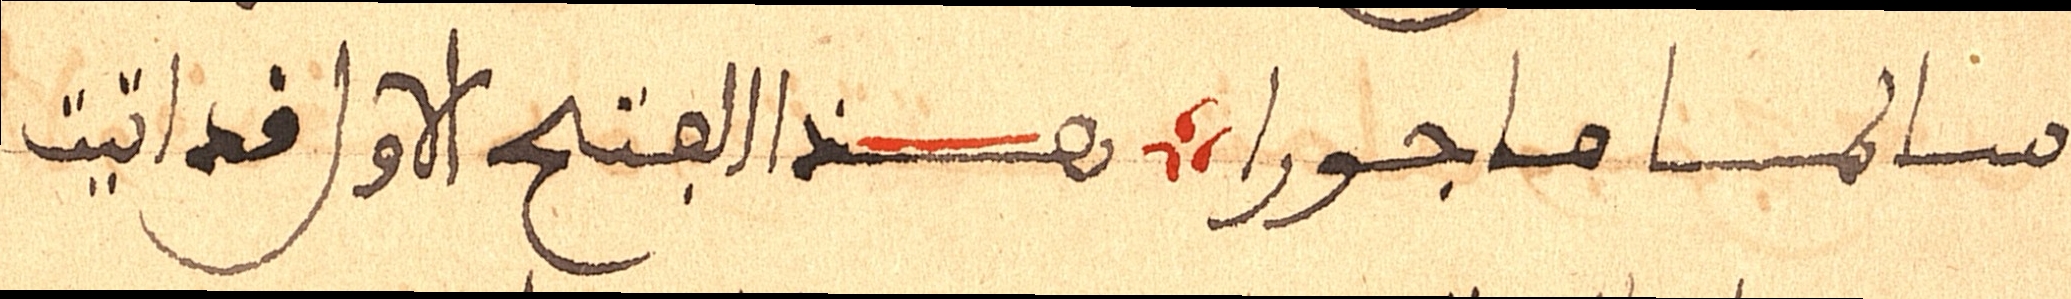سالما ماجورا هذا الفتح الاول قداتيت
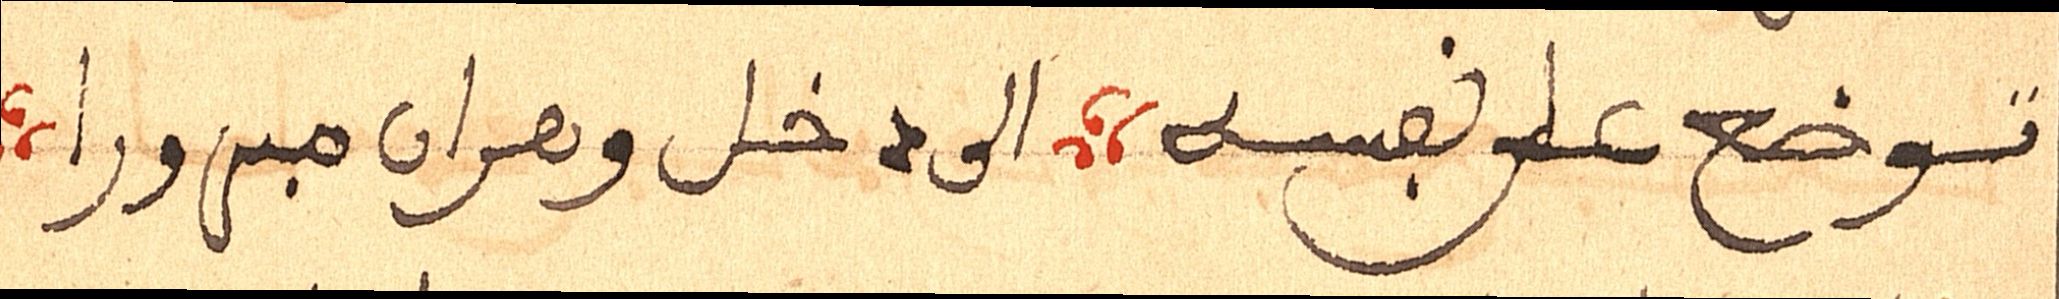توضع على نفسه الى دخل وهران مبرورا
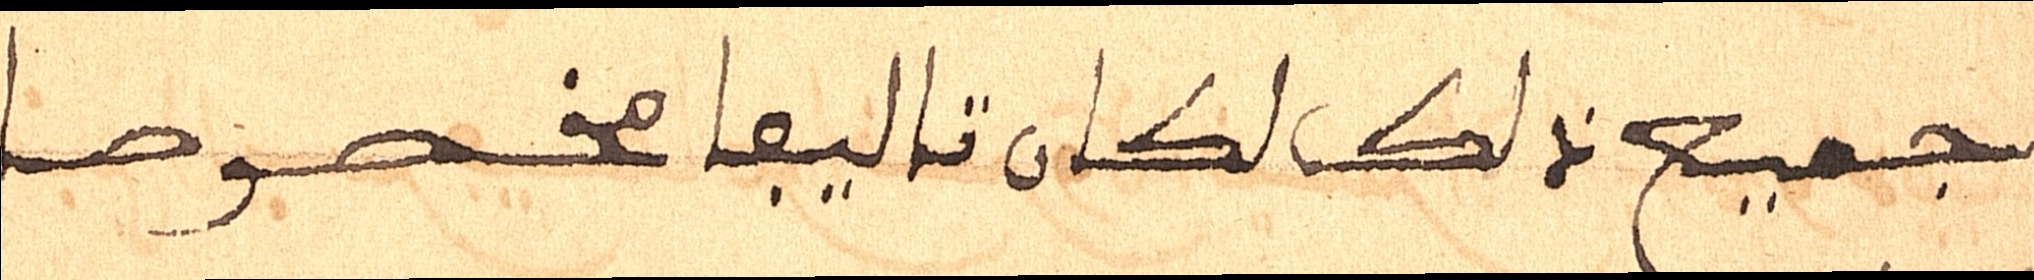جميع ذلك لكان تاليفا مخصوصا
